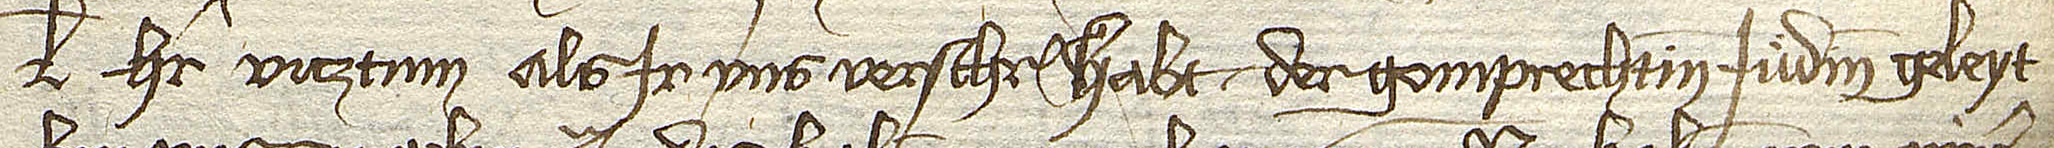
L* hr* vicʒtum als Ir vns verſchr* habt / der gomprechtin* Iüdin* geleyt
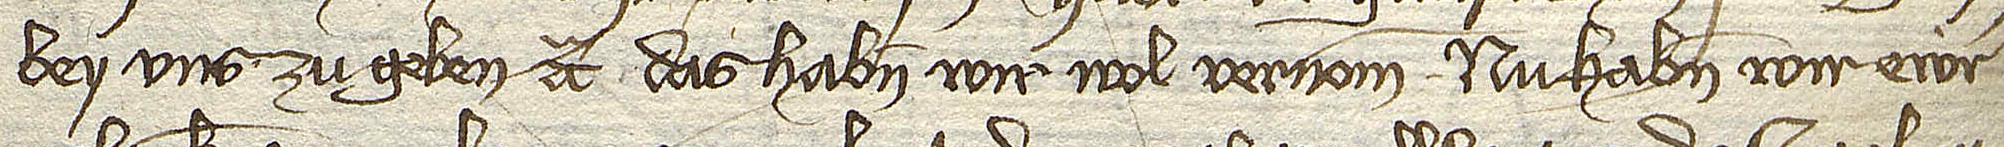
bey vns ʒu gebn* ec* das habn* wir wol vernom* . Nu habn* wir eẅr*
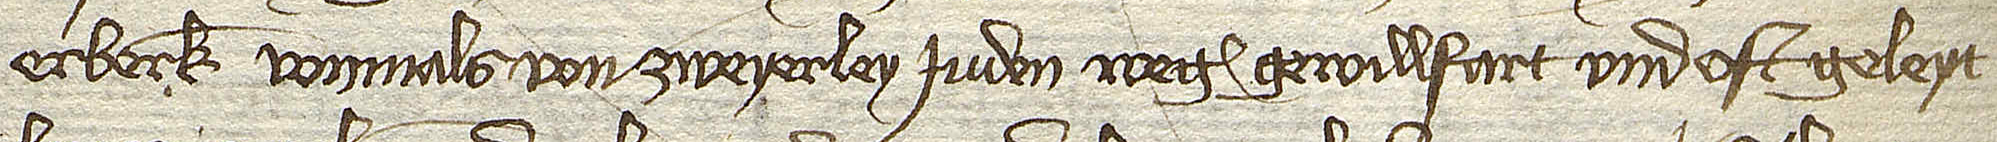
erberk* vormals von ʒweyerley Iuden weg* gewillfart vnd oft geleyt
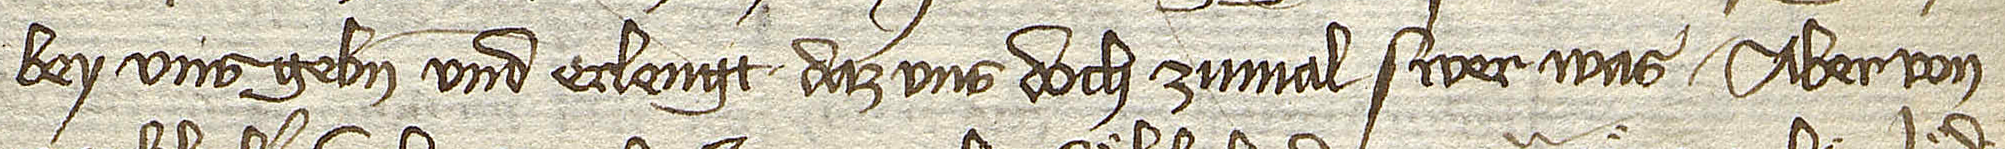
bey vns gebn* vnd erlengt / daʒ vns doch ʒumal ſwer was / Aber von
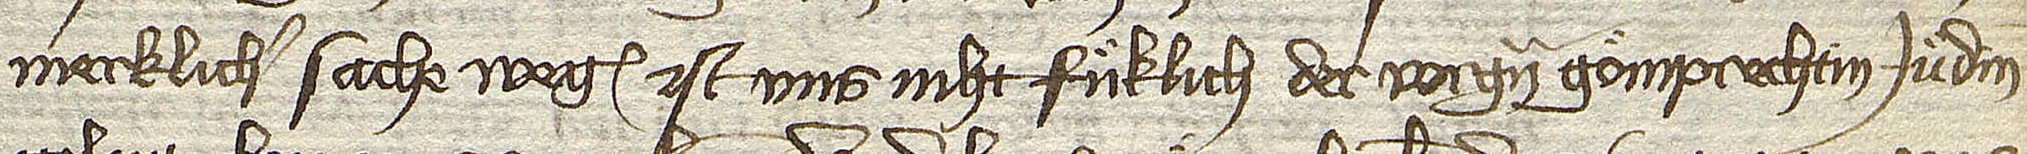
merklich* ſache weg* iſt vns niht füklich der vorgn* gömprechtin Iüdin
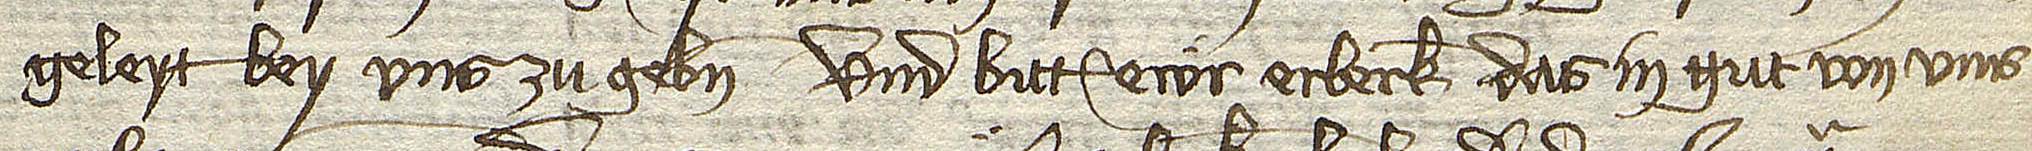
geleyt bey vns ʒu gebn* / Vnd bitt* eẅr erberk* das in gut von vns
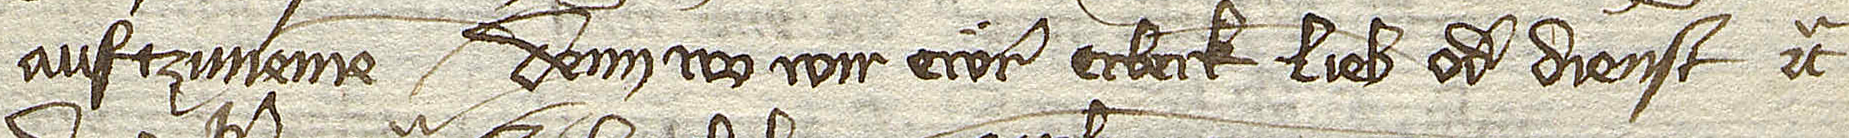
aufcʒuneme* / Denn wo wir eẅr* erberk* lieb od* dienſt ec*
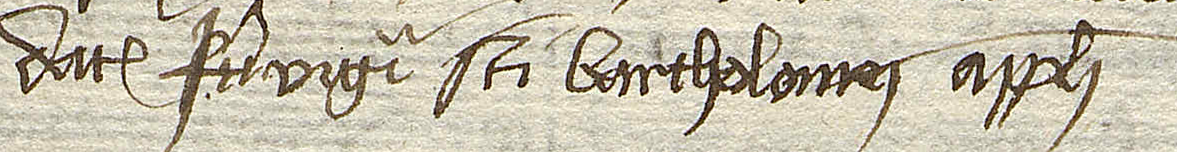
Dat* In vigi* ſci* bartholomei appli*
